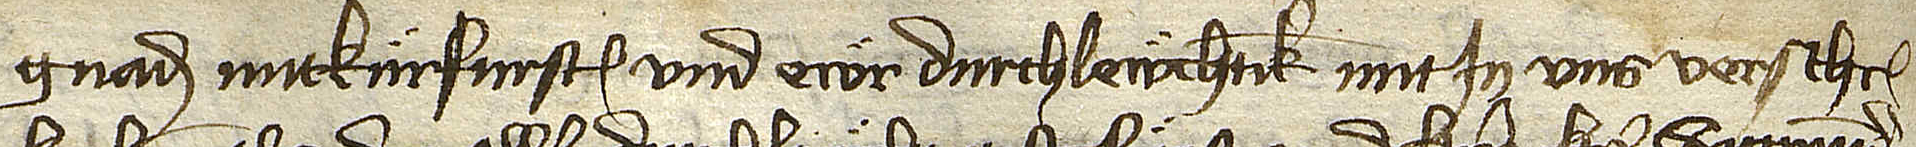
gnad* mitkürfurſt* vnd ewr durchlewchtik* mit In vns verſchr*
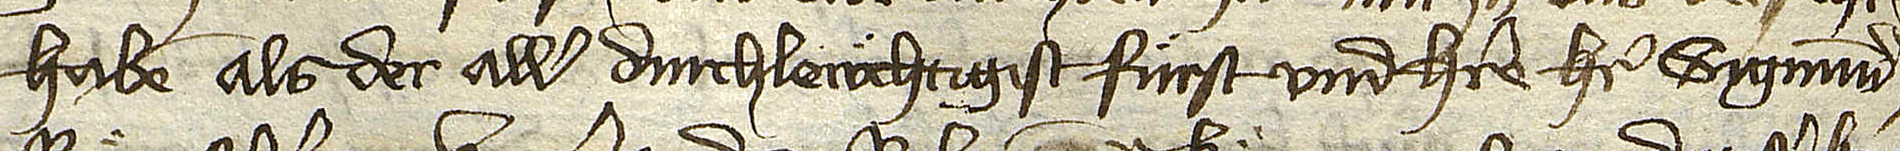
habe* als der all* durchlewchtigiſt* fürſt vnd h*re h*r Sigmu*d
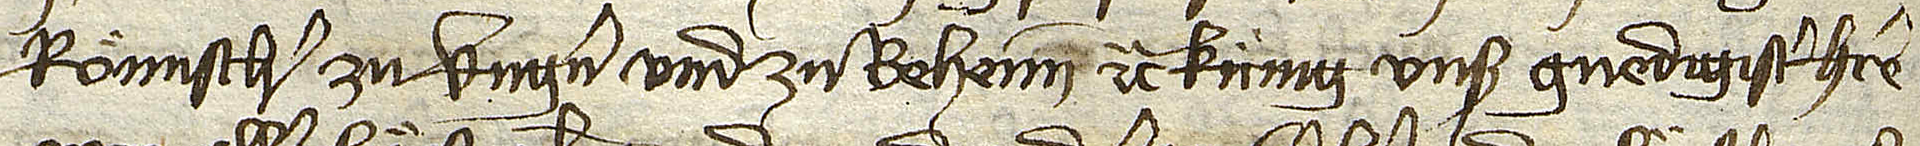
Römiſch* ʒu Vng*n vnd ʒu Beheim ec* künig vnſ* gnedigiſt* h*re
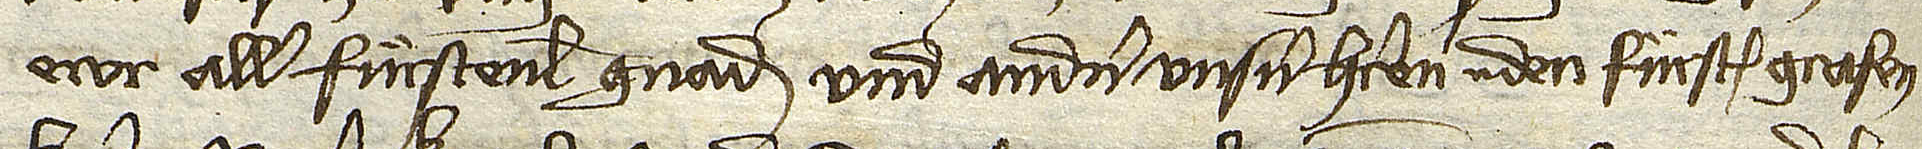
ewr all* fürſtenl* gnad* vnd and*n vnſ*n h*ren ~ den fürſt* grafen
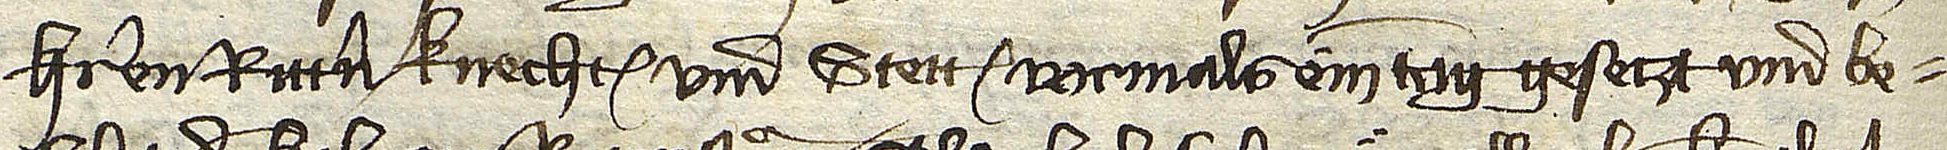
h*ren Ritt*n knecht* vnd Stett* vormals ein* tag geſecʒt vnd be =
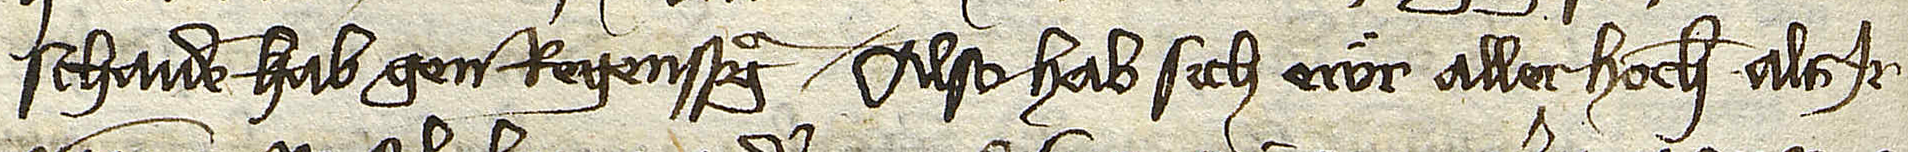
ſchaide* hab gen Regenſp*g / Alſo hab ſich ewr aller hoch* . als Ir
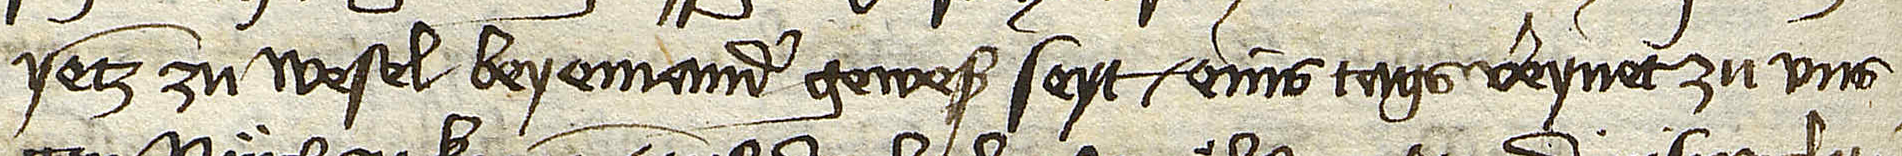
yecʒ* ʒu Weſel beyeinand* geweſ* ſeyt / eins tags v*eynet ʒu vns
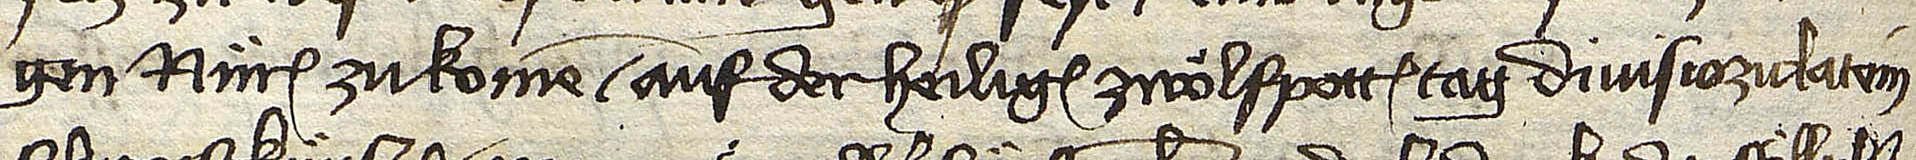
gen Nür* ʒu kome* / auf der heilig* ʒwölfpott* tag diuiſio ʒu latein
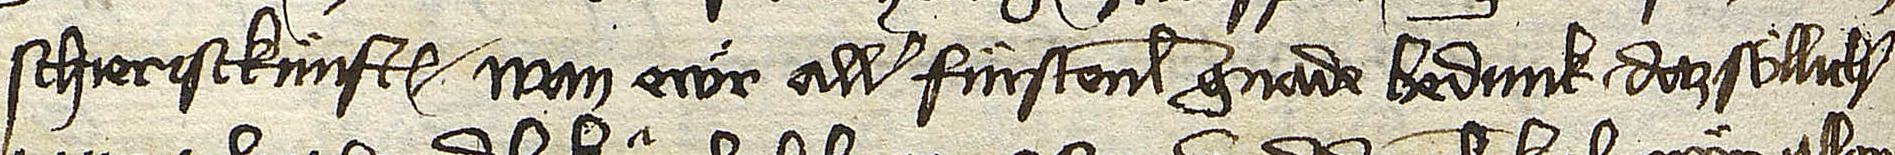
ſchieriſtkünft* / wan ewr all* fürſtenl* gnade bedunk / daʒ ſöllich*
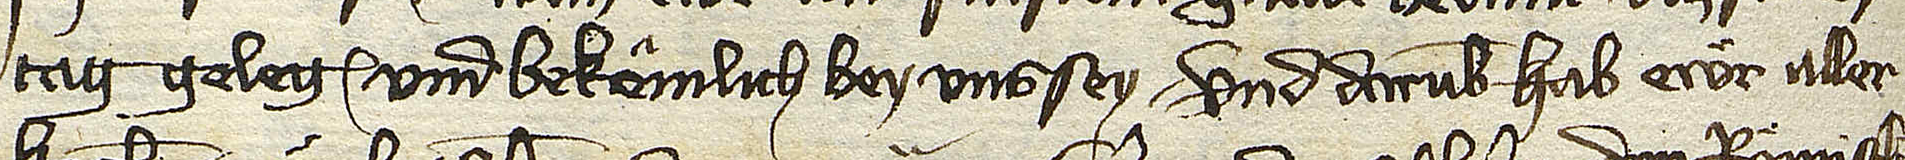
tag geleg* vnd bekëmlich bey vns ſey / Vnd daru*b hab ewr aller
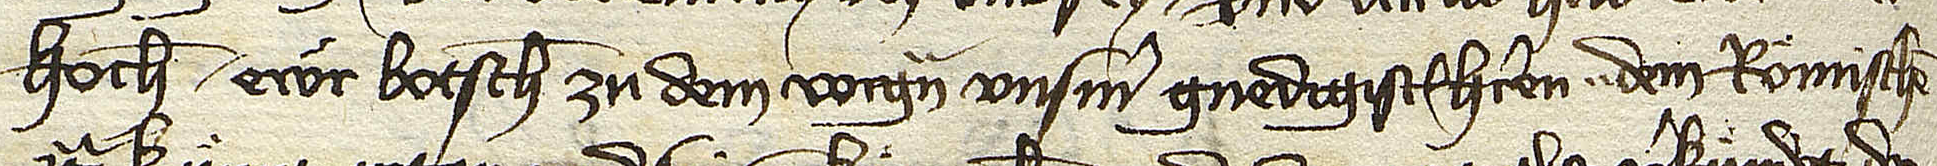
hoch* / ewr botſch* ʒu dem vorg*n vnſ*m gnedigiſt* h*ren ~ dem Römiſche*
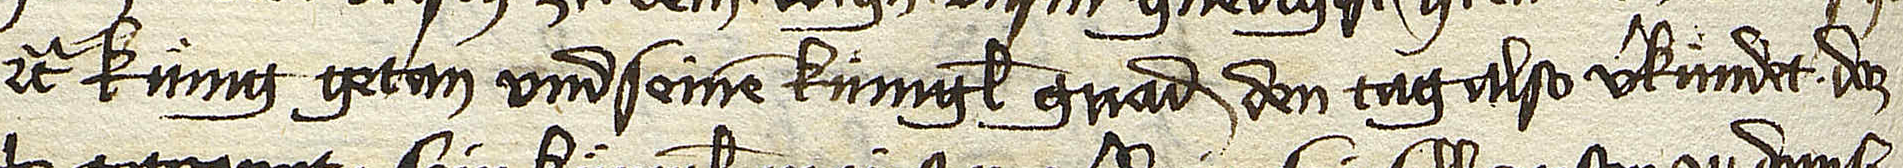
ec* künig getan vnd ſeine* künigl* gnad* den tag alſo v*kündt . daʒ
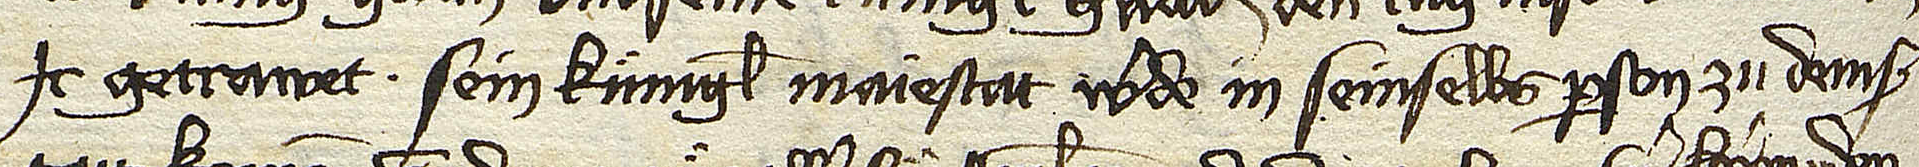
Ir getrawet . ſein künigl* maieſtat w*de in ſeinſelbs p*ſon ʒu demſ*
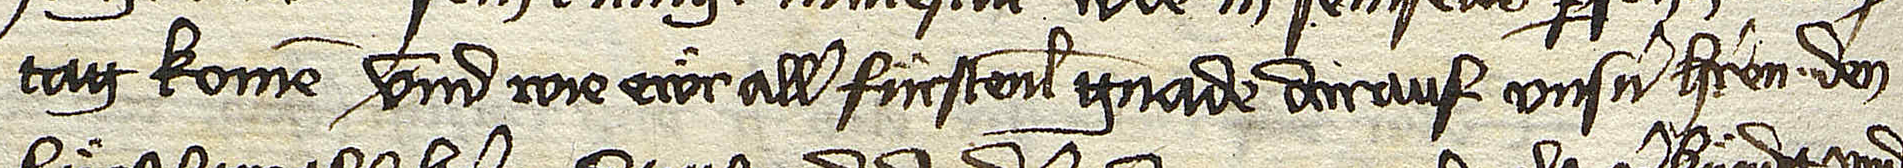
tag kome* / Vnd wie ewr all* fürſtenl* gnade darauf vnſ*n h*ren ~ den
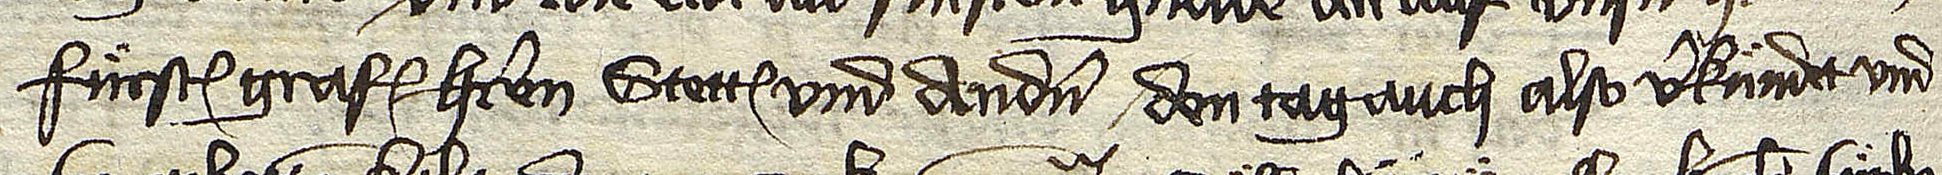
Fürſt* graf* h*ren Stett* vnd And*n / den tag auch alſo v*kündet vnd
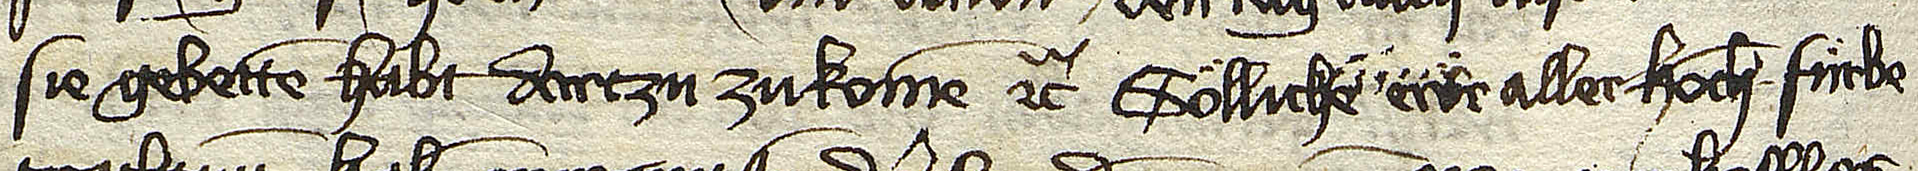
ſie gebette* habt darcʒu ʒukome* ec* Sölliche ewr aller hoch* . fürbe
